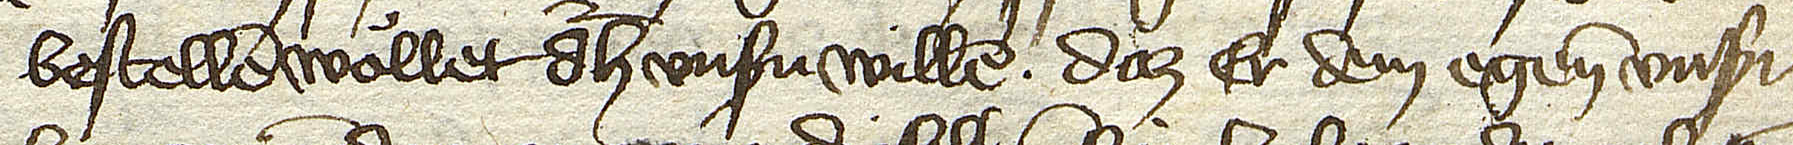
beſtelle* wöllet d*h vnſ*n wille* . daʒ Er dem egen* vnſ*r
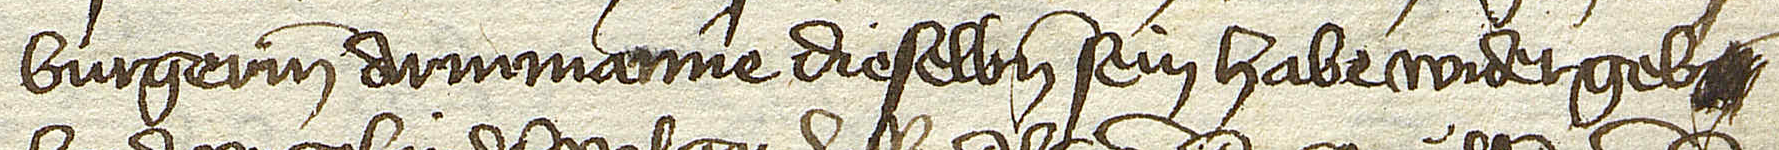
burgerin Armmanne dieſelbn* ſein habe widergebn
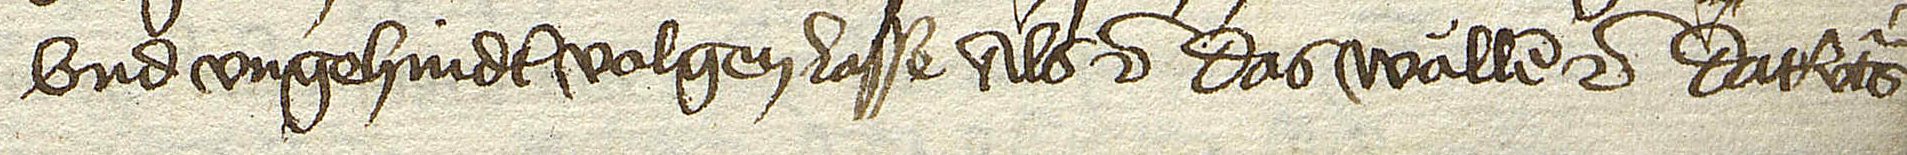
vnd vngehindt* volgen laſſe Als ec* Das wölle* ec* Dat* vts*
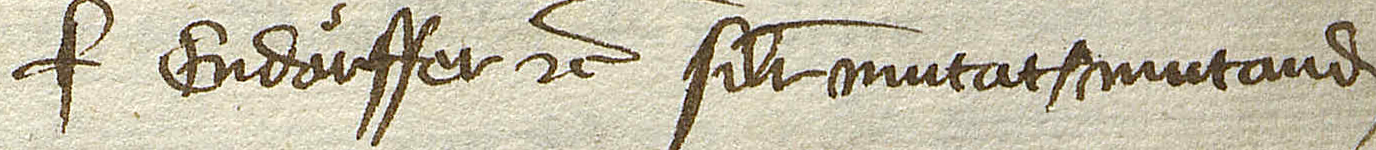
F Endörffer ec* ſilr* mutat* mutand*
